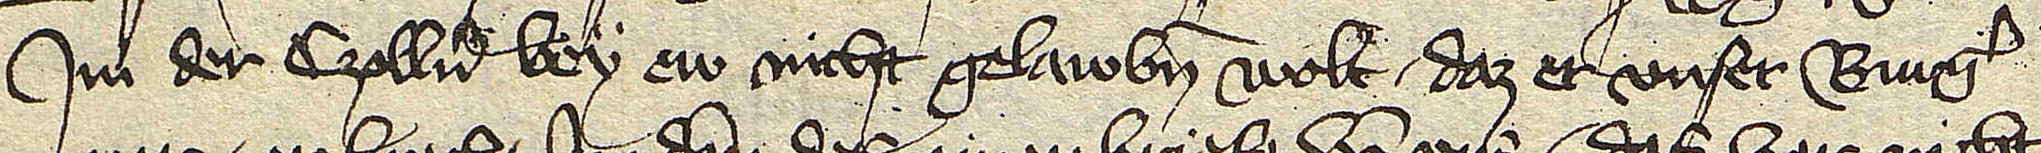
Im der Cʒolln* bey ew nicht gelawbn* wolt / daʒ er vnſer Burg*
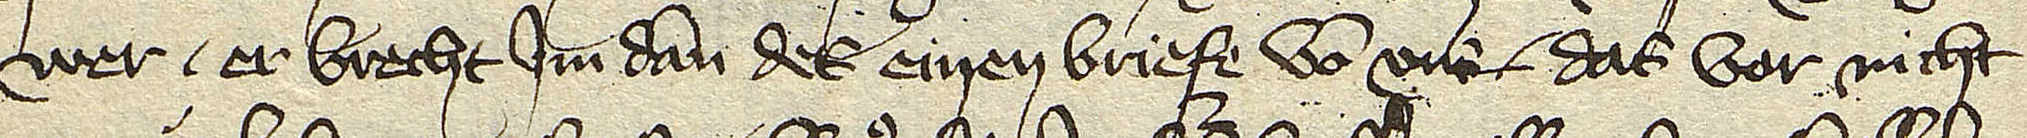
wer / er brecht Im dan* des einen briefe vo* vns / das vor nicht
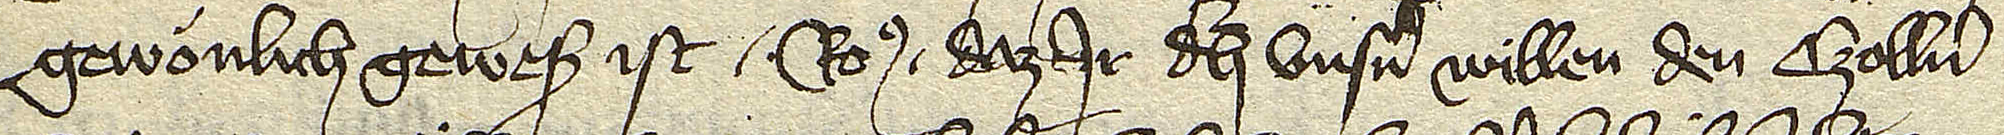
gewönlich geweſ* iſt / . Ro* / daʒ Ir d*h vnſn* willen den Cʒolln*
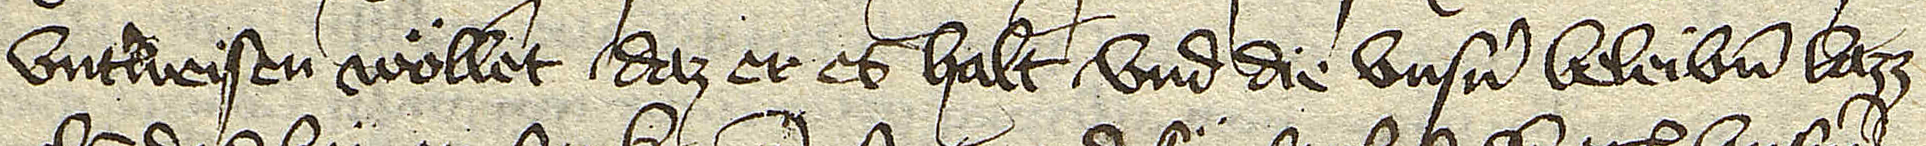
vnt*weiſen wöllet / daʒ er es halt / vnd die vnſn* beleibn* laʒʒ
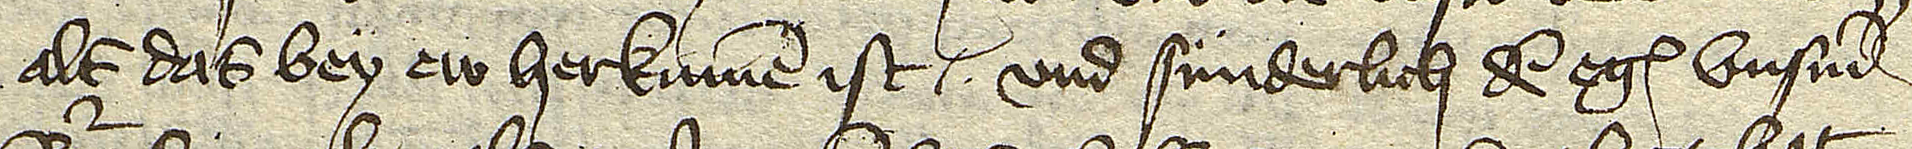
als das bey ew herkume* iſt / . vnd ſünderlich d* eg* vnſm*
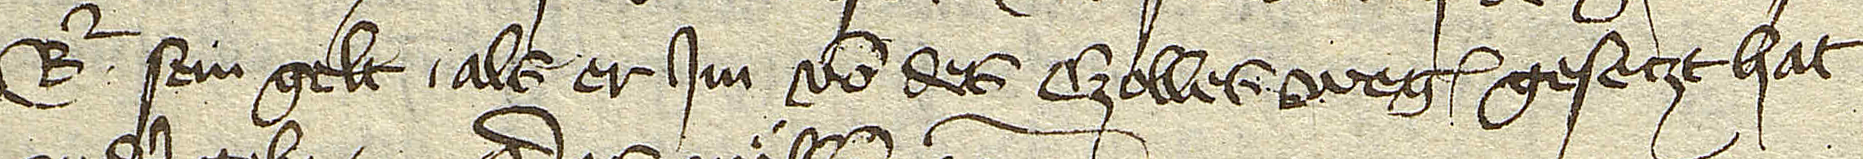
B* ſein gelt / als er Im vo* des Cʒolles weg* geſecʒt hat
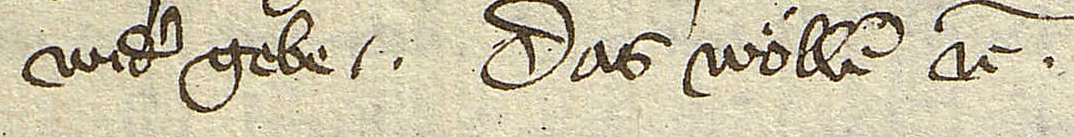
wid* gebe / . Das wölle* ec* .
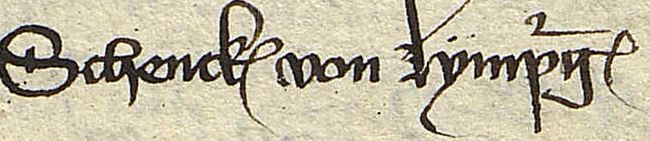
Schenck* von Lymp*g*
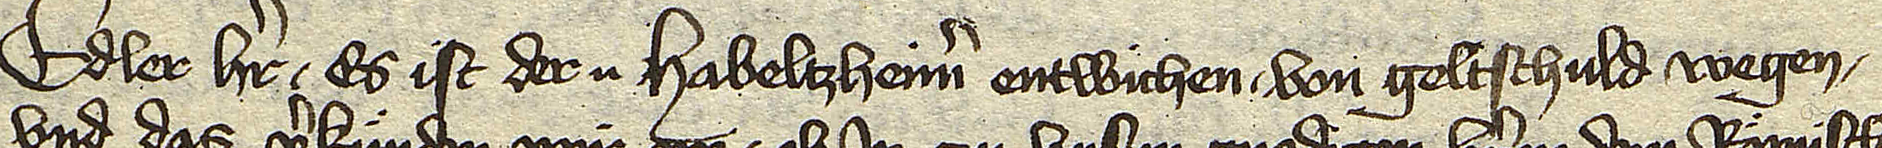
Edler hr* / Es iſt der ~ habeltʒheim* entwichen / von geltſchuld wegen /
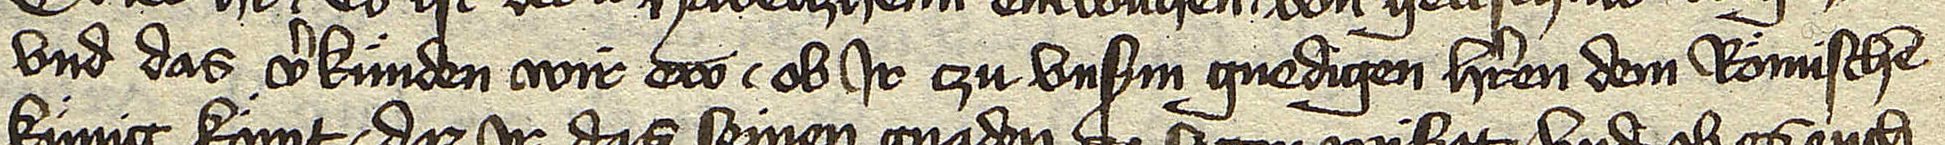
vnd das v*künden wir ew* / ob Ir cʒu vnſ*m gnedigen h*ren dem Römiſche*
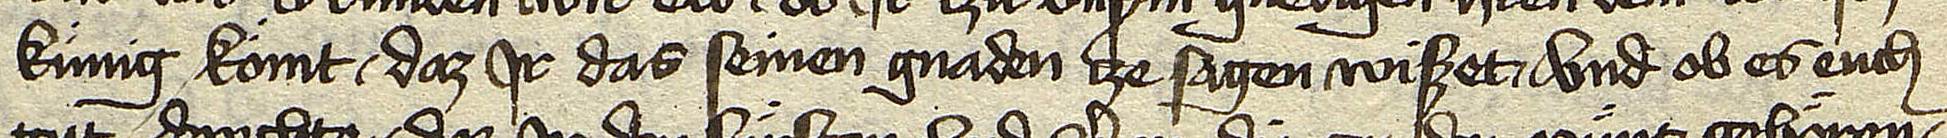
künig kömt / daʒ Ir das ſeinen gnaden cʒe ſagen wiſʒet / vnd ob es euch
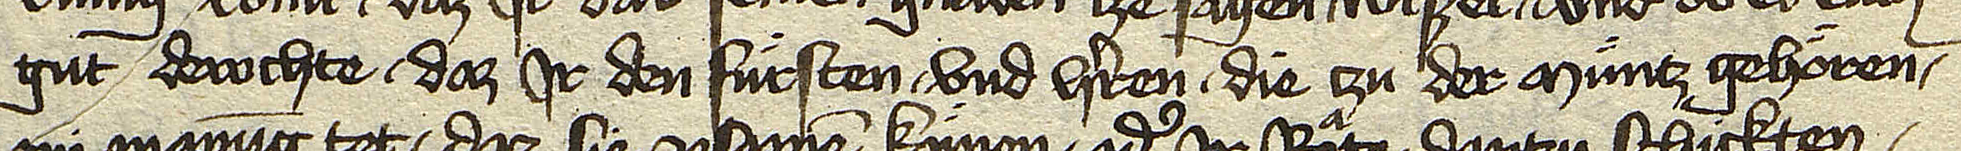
gut dewchte / daʒ Ir den fürſten / vnd h*ren / die cʒu der Müntʒ gehören /
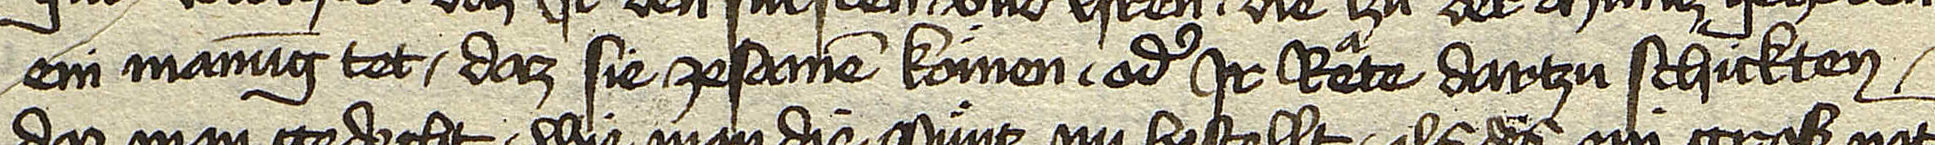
ein manug* tet / daʒ ſie cʒeſame* kömen / od* Ir Rëte dartʒu ſchicken /
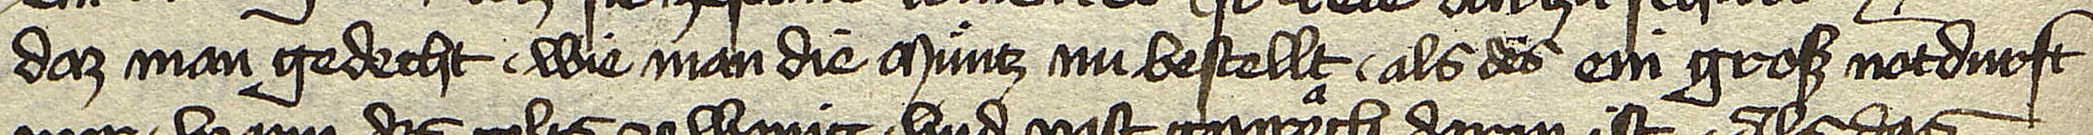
daʒ man gedecht / wie man die Müntʒ nu beſtellt / als des ein groſʒ notdurft
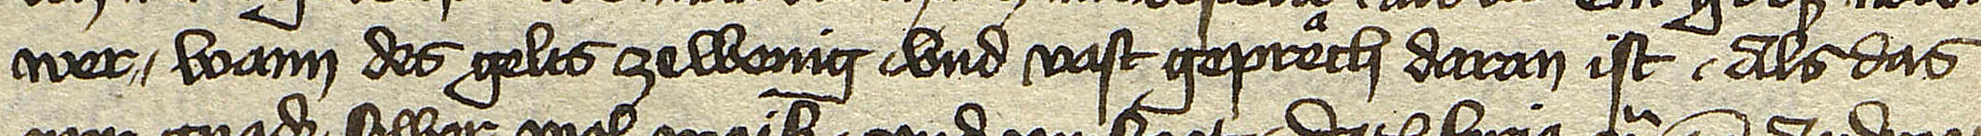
wer / wann des cʒewenig / vnd vaſt geprëch daran iſt / Als das
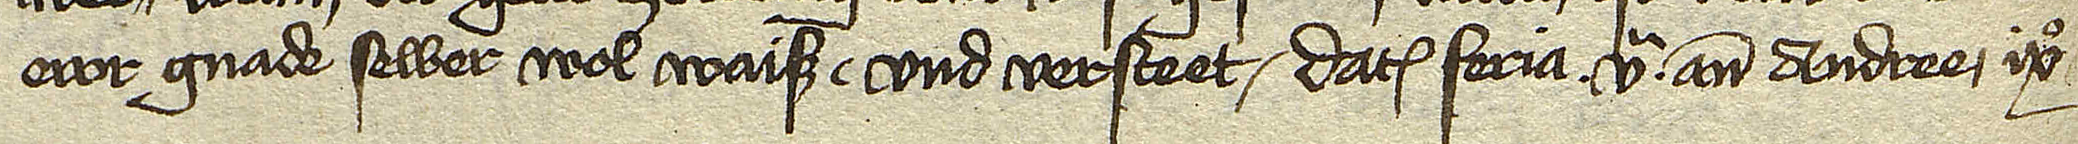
ewr gnade ſelber wol waiſʒ / vnd verſteet / Dat* feria . v* . an* Andree / ix*
